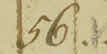56
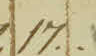17.
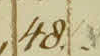48.
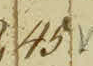45
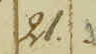21.
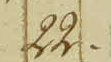22
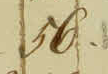56
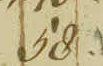58
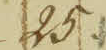25
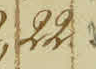22
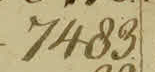7483.
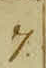7.
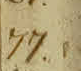77.
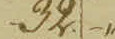32.
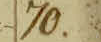70.
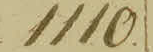1110.
